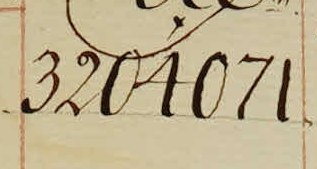3204071
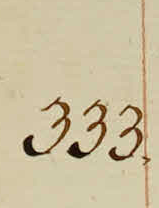333
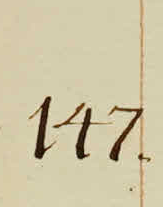147
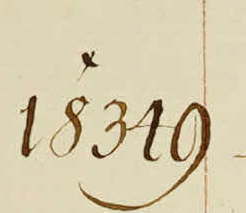18349
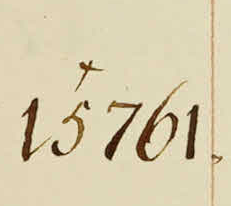15761
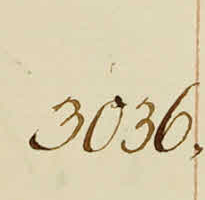3036
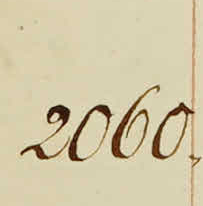2060
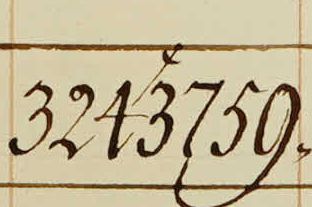3243759
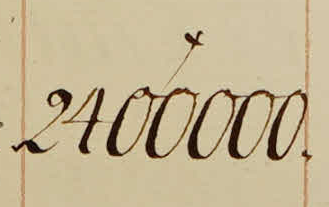240000
